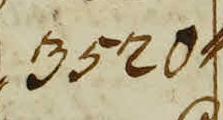3520
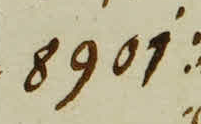8901
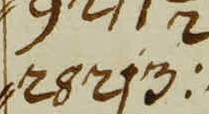28213
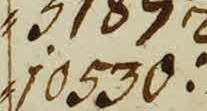10530
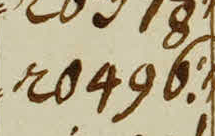20496
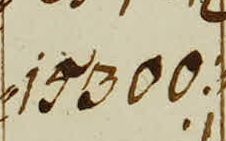15300
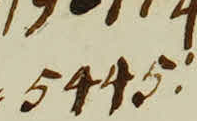5445
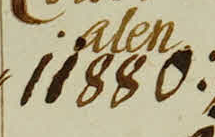11880
